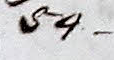54
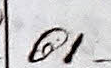61
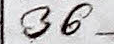36
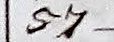57
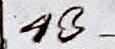43
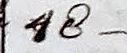48
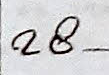28
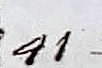41
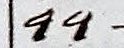44
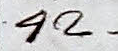42
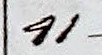41
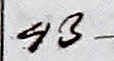43
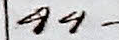44
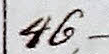46
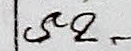52
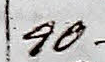40
